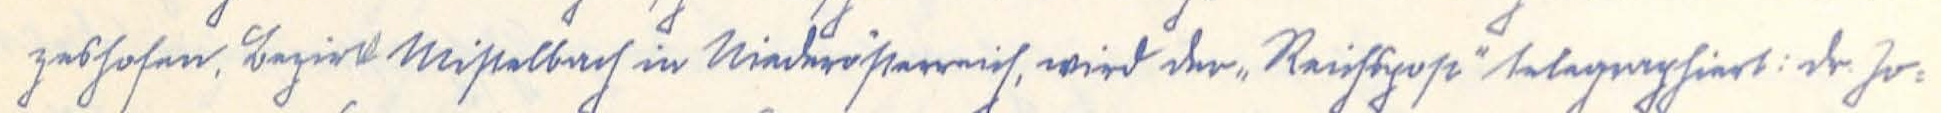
zeshofen, Bezirk Mistelberg in Niederösterreich, wird der "Reichspost" telegraphiert: Dr. Jo-
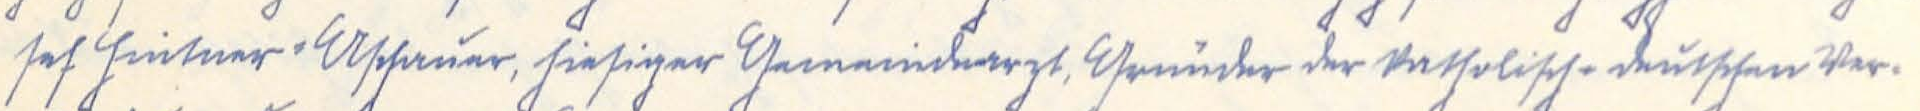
sef Hintner-Aschauer, hiesiger Gemeindearzt, Gründer der katholisch-deutschen Ver-
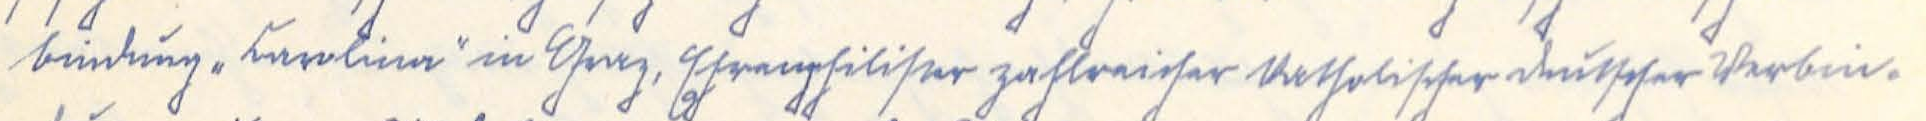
bindung "Carolina" in Graz, Ehrenphilister zahlreicher katholischer deutscher Verbin-
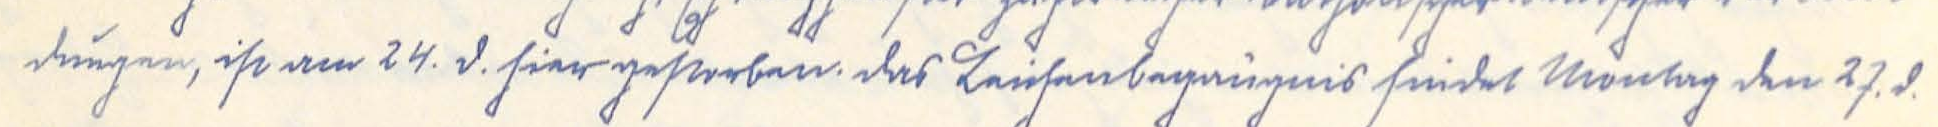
dungen, ist am 24. 9. hier. gestorben. Das Leichenbegräbnis findet Montag den 17.9.
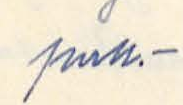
statt.
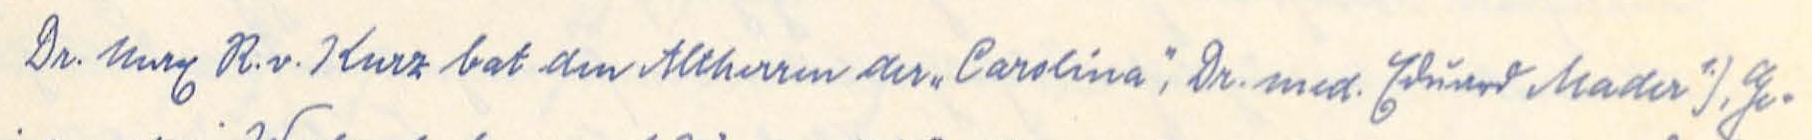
Dr. Max R. v. Kurz bat den Altherren der "Carolina", Dr. med. Eduard Mader 1.), Ge-
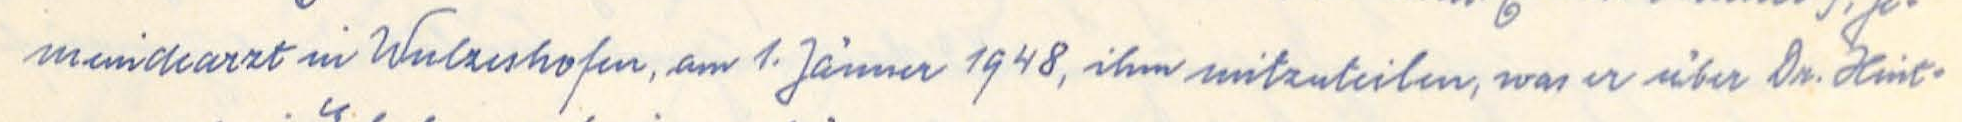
meindeazt in Wulzeshofen, am 1. Jänner 1948, ihm mitzuteilen, was er über Dr. Hint-
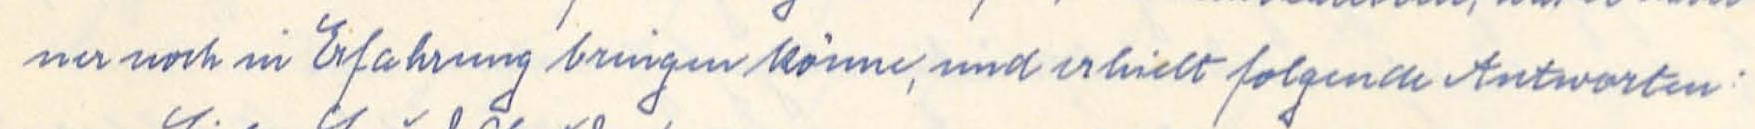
ner noch in Erfahrung bringen könne, und erhielt folgende Antworten:
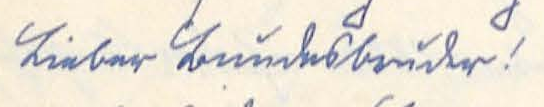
Lieber Bundesbruder!
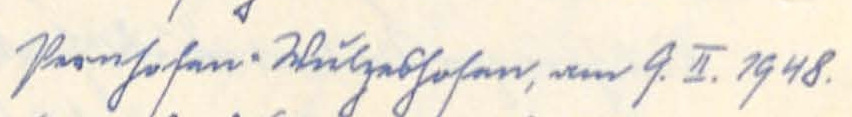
Pernhofen-Wulzeshofen, am 9.2.1948
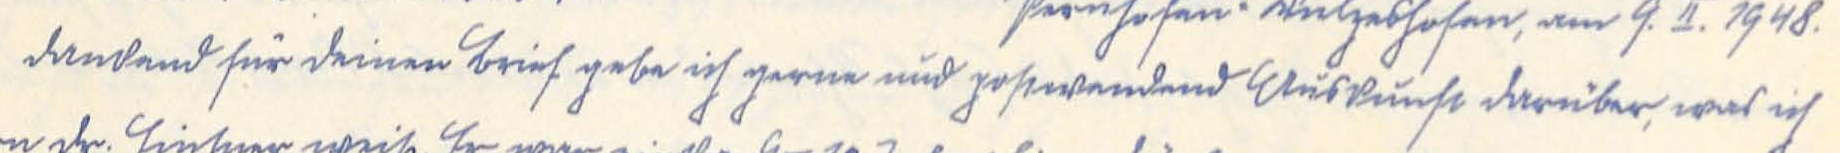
Dankend für deinen Brief gebe ich gern und postwendend Auskunft darüber, was ich
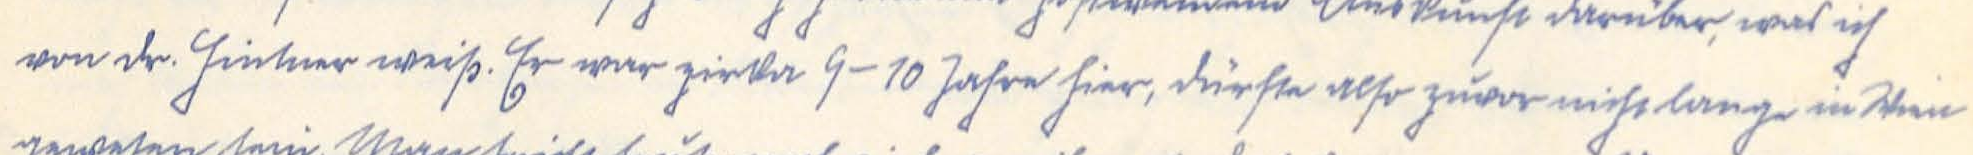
von Dr. Hintner weiß. Er war zirka 9-10 Jahre hier, dürfte also zuvor nicht lang in Wien
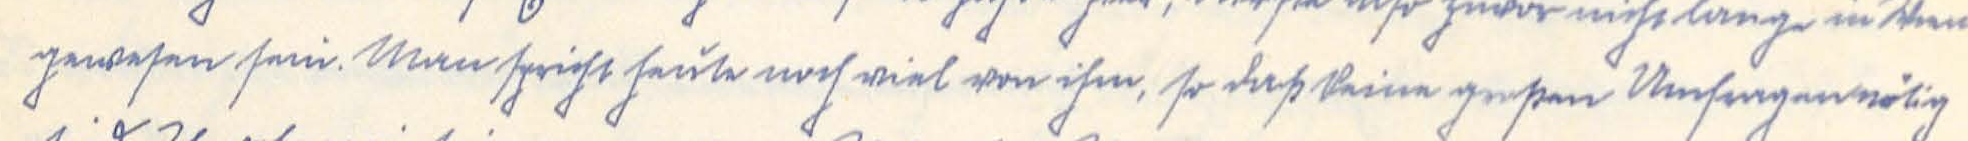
gewesen sein.Man spricht heute noch viel von ihm, so daß keine großen Umfragen nötig
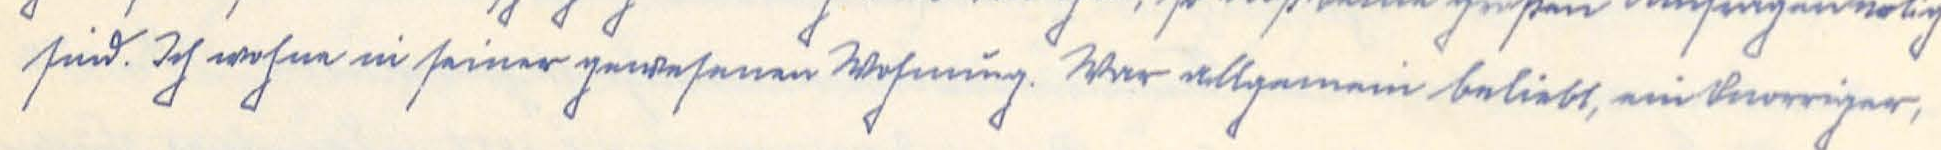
sind. Ich wohne in seiner gewesenen Wohnung. War allgemein beliebt, ein knorriger,
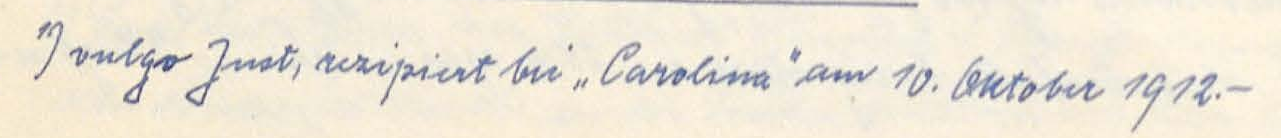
1.) vulgo Just rezipiert bei "Carolina" am 10. Oktober 1912.-
